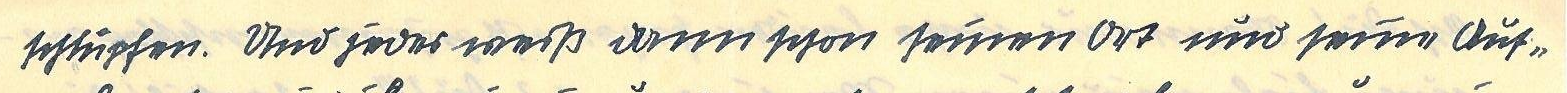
schlüpfen. Und jeder weiß dann schon seinen Ort und seine Auf¬
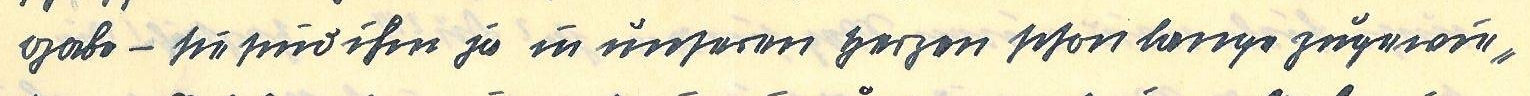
gabe – sie sind in unseren Herzen schon lange zugewiesen.
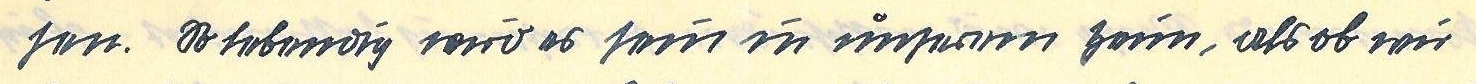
So lebendig wird es sein in unserem Heim, als ob wir
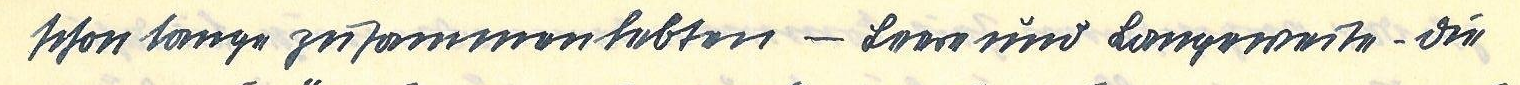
schon lange zusammenlebten – Leere und Langeweile – die
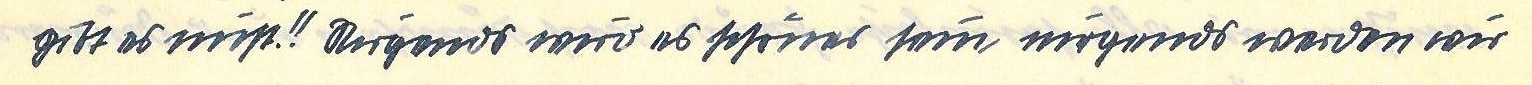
gibt es nicht!! Nirgends wird es schöner sein, nirgends werden wir
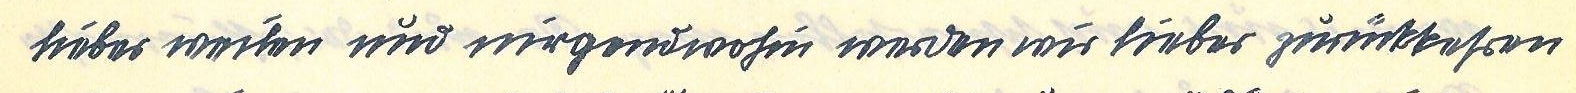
lieber weilen und nirgendwohin werden wir lieber zurückkehren
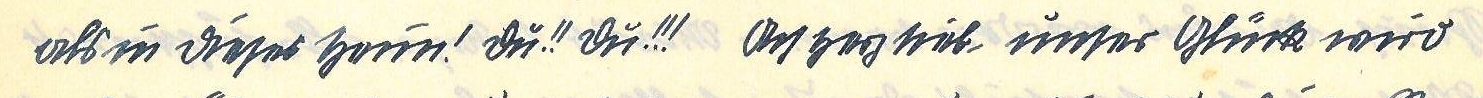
als in dieses Heim! Du!! Du!!! Ach Herzlieb, unser Glück wird
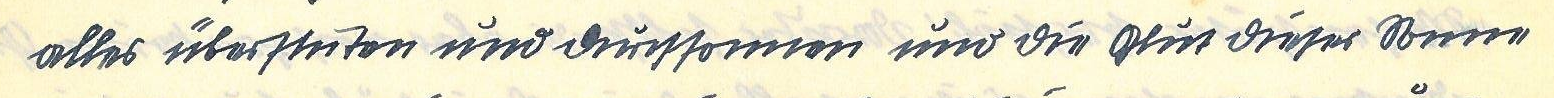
alles überfluten und durchsonnen und die Glut dieser Sonne
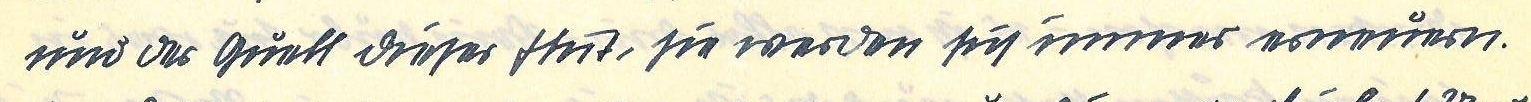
und der Quell dieser Glut, sie werden sich immer erneuern.
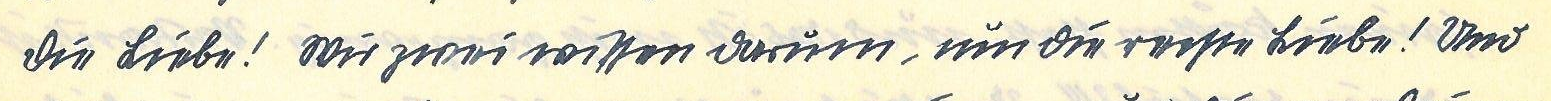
Die Liebe! Wir zwei wissen darum, um die rechte Liebe! Und
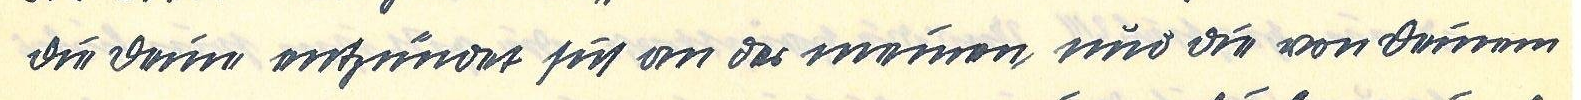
die Deine entzündet sich an der meinen, und die von Deinem
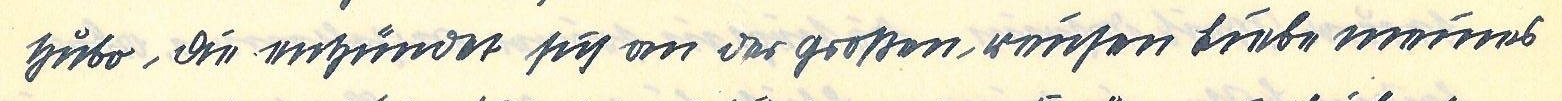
Hubo, die entzündet sich an der großen, reichen Liebe meines
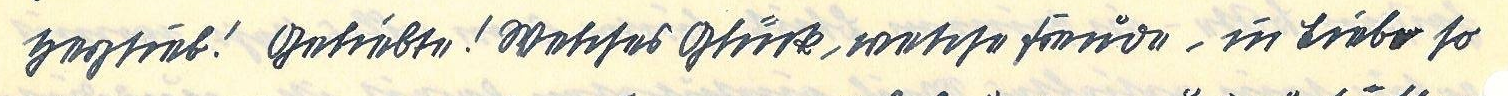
Herzlieb! Geliebte! Welches Glück, welche Freude, in Liebe so
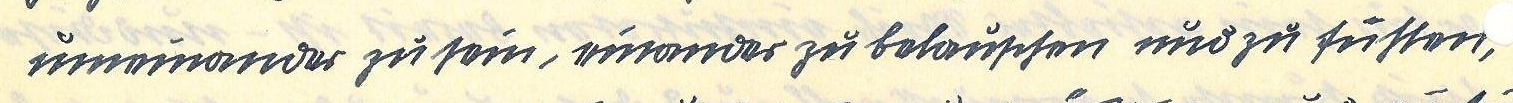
umeinander zu sein, einander zu belauschen und zu fühlen,
